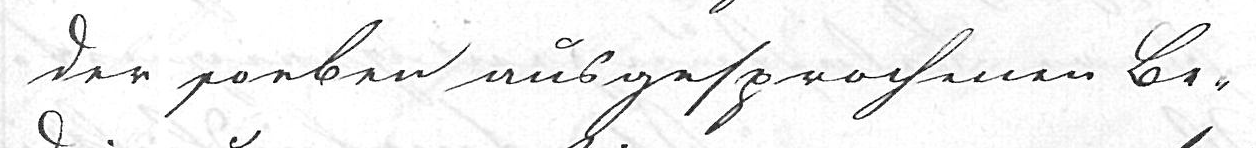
der soeben ausgesprochenen Be-
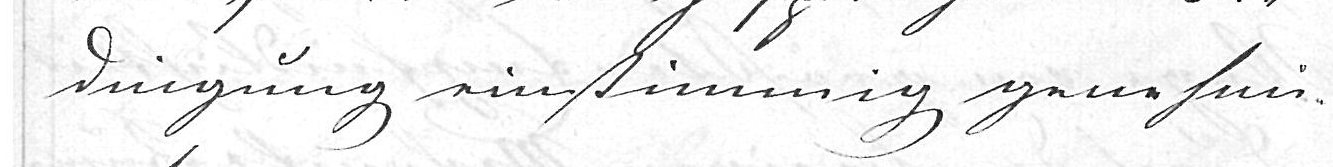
dingung einstimmig genehmi-
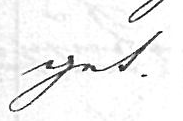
get.
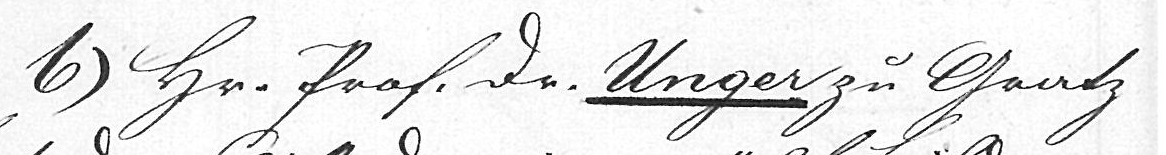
b) Hr. Prof. Dr. Unger zu Gratz
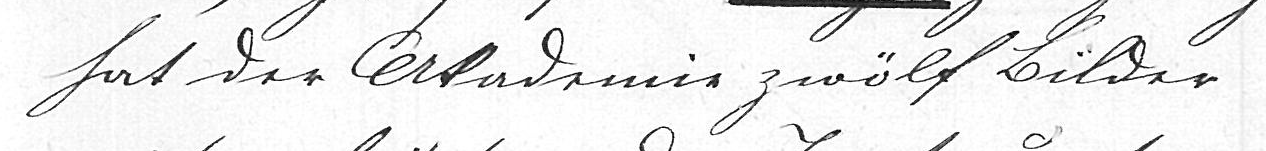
hat der Akademie zwölf Bilder
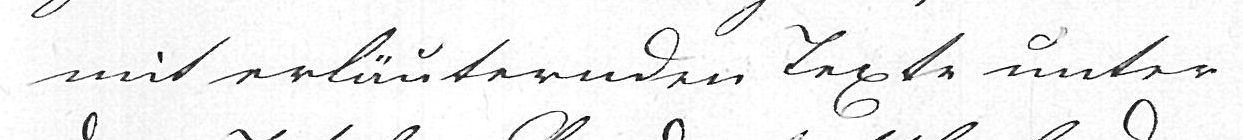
mit erläuternden Texte unter
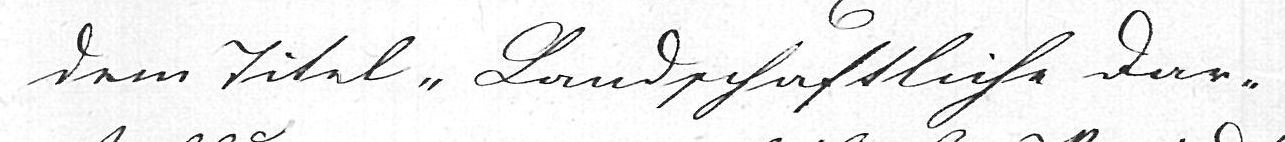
dem Titel "Landschaftliche Dar-
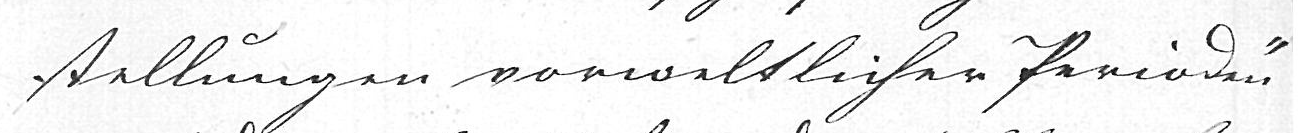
stellungen vorweltlicher Perioden"
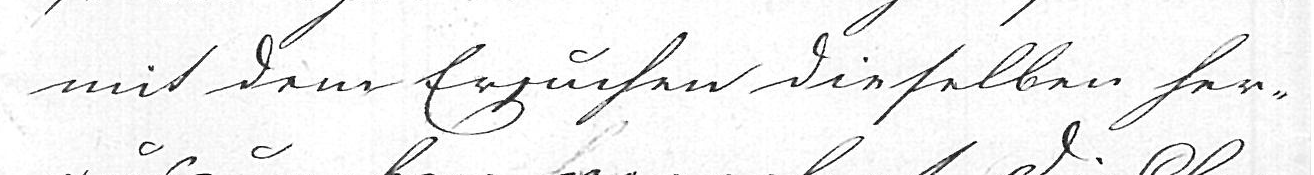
mit dem Ersuchen dieselben her-
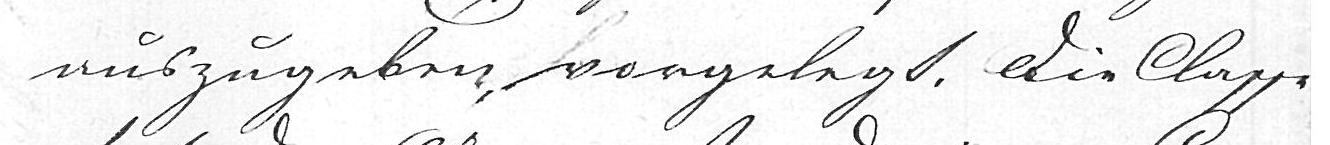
auszugeben, vorgelegt. Die Classe
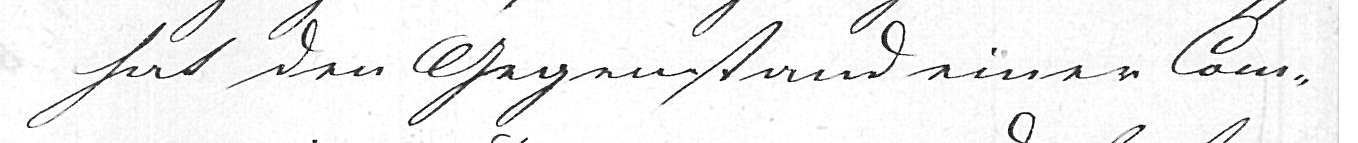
hat den Gegenstand einer Com-
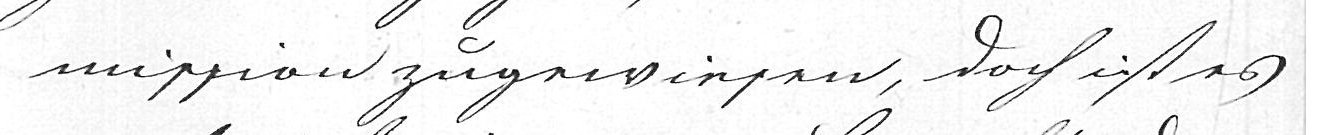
mission zugewiesen, doch ist es
